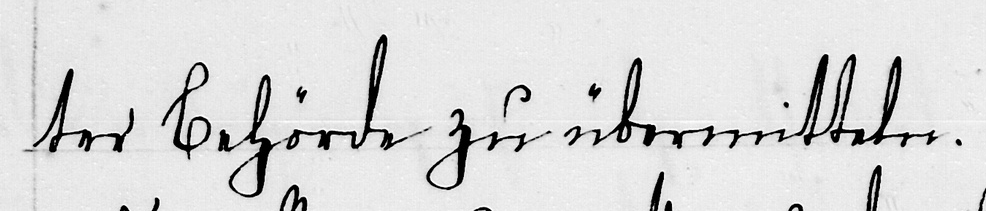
ter Behörde zu übermitteln.
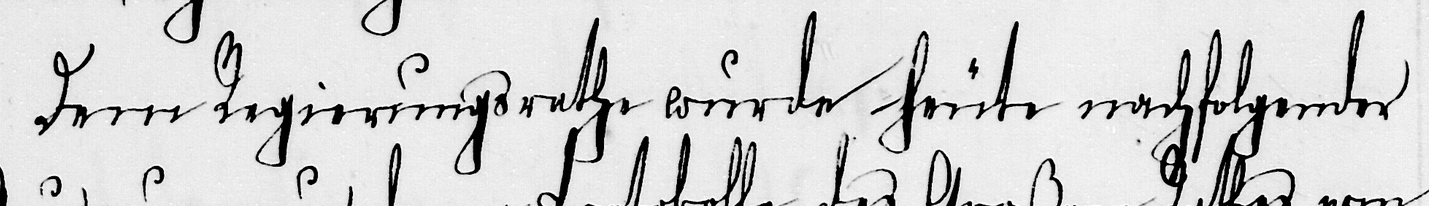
Dem Regierungsrathe wurde heute nachfolgender
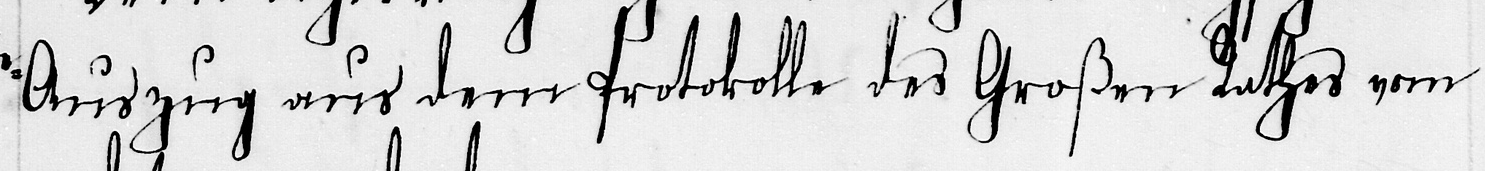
Auszug aus dem Protokolle des Großen Rathes vom
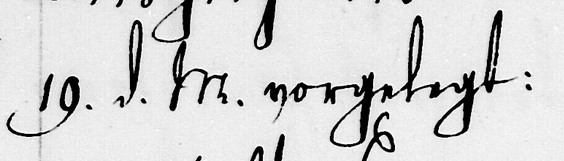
19. d. M. vorgelegt:
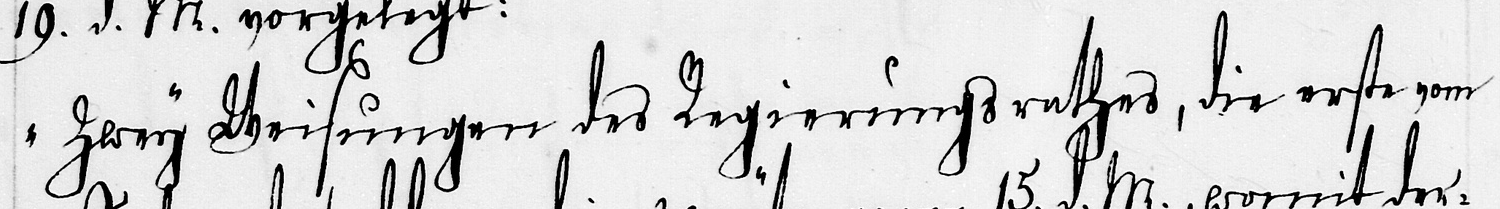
„Zwey Weisungen des Regierungsrathes, die erste vom
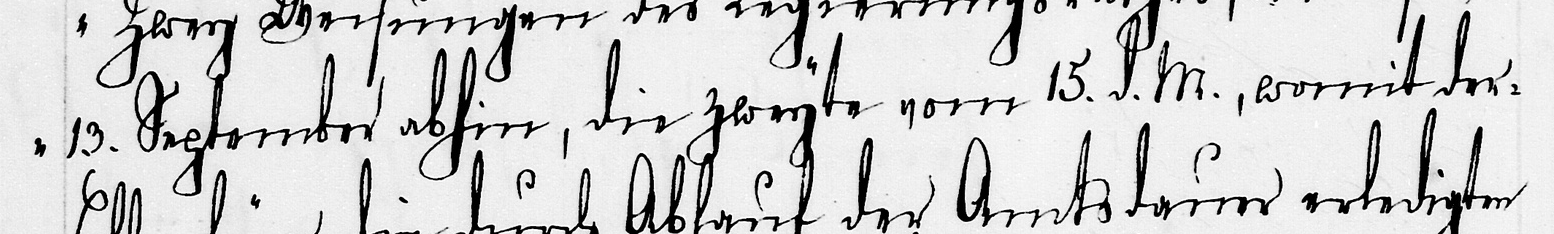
13. September abhin, die zweyte vom 15. d. M., womit der¬
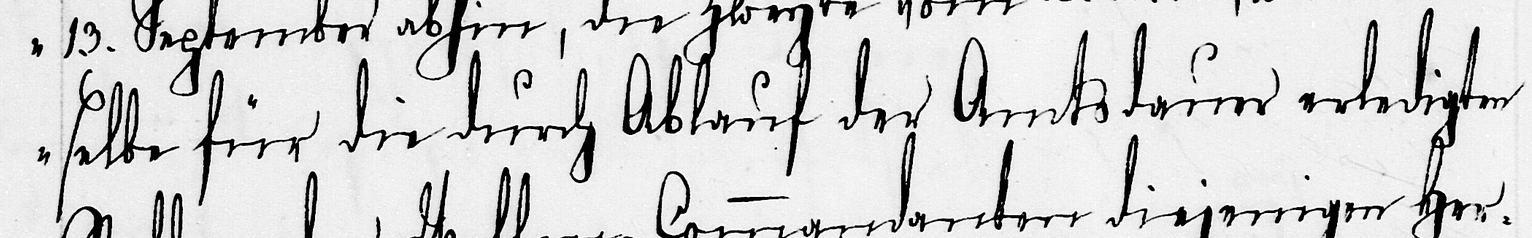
selbe für die durch Ablauf der Amtsdauer erledigten
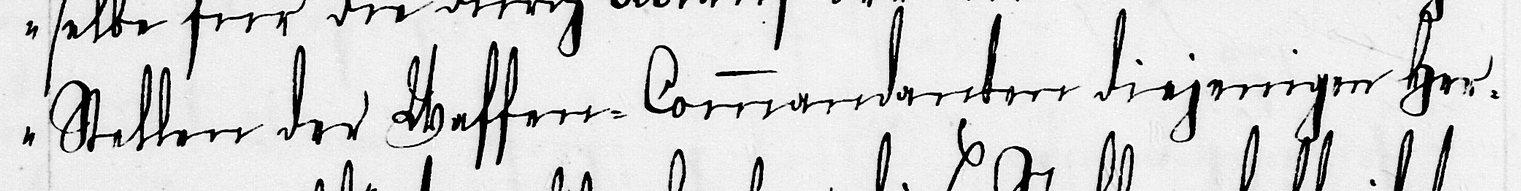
Stellen der Waffen-Commandanten diejenigen Her¬
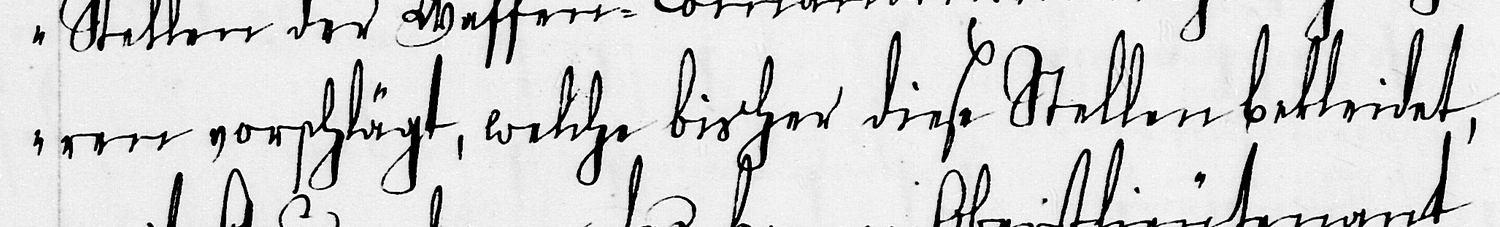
ren vorschlägt, welche bisher diese Stellen bekleidet,
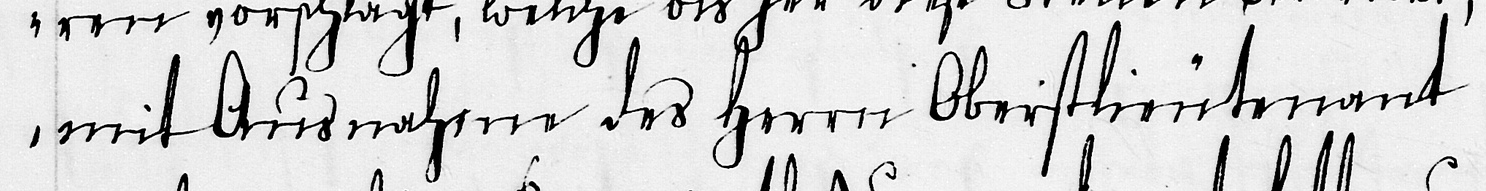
mit Ausnahme des Herrn Oberstlieutenant
